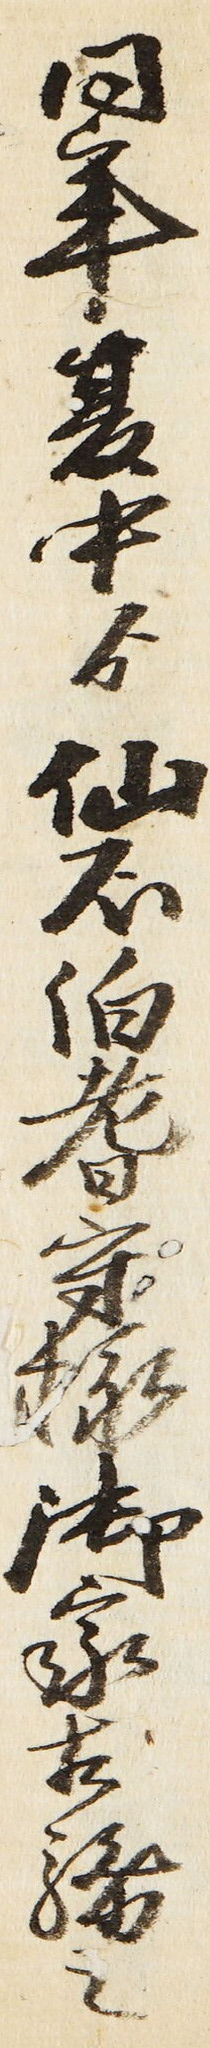同年夏中ゟ仙石伯耆守様御家相騒之
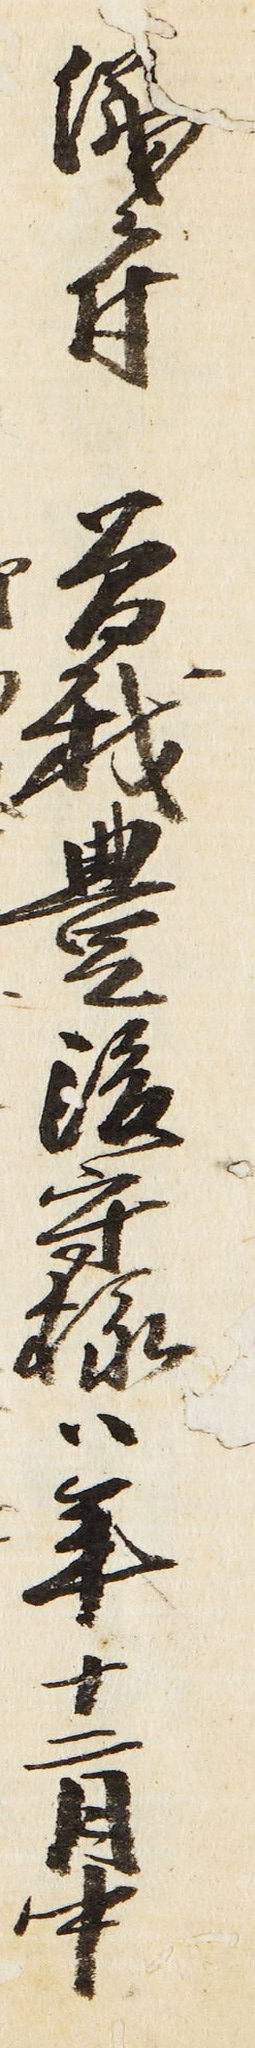儀ニ付曽我豊後守様同年十二月中
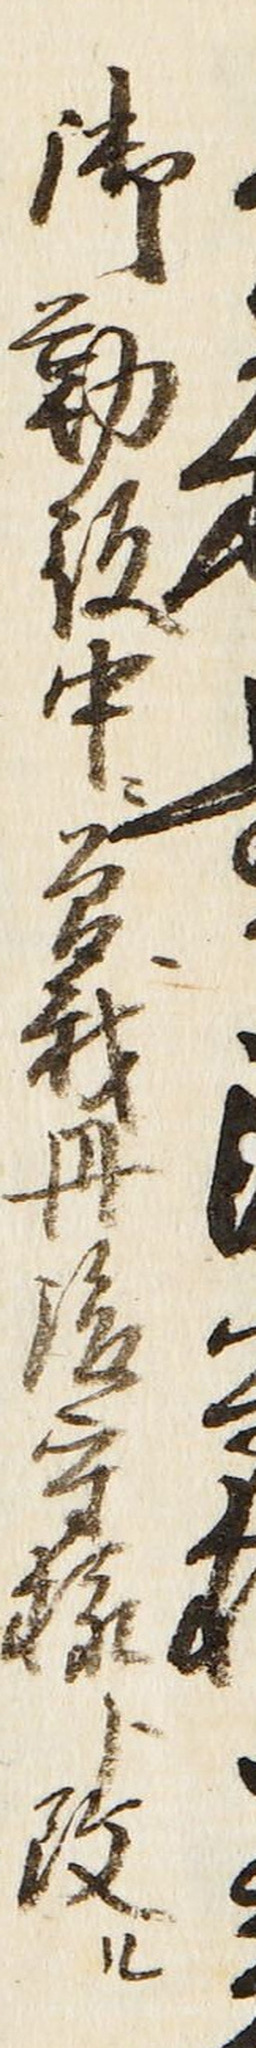御勤役中ニ曽我丹後守様ト改ル
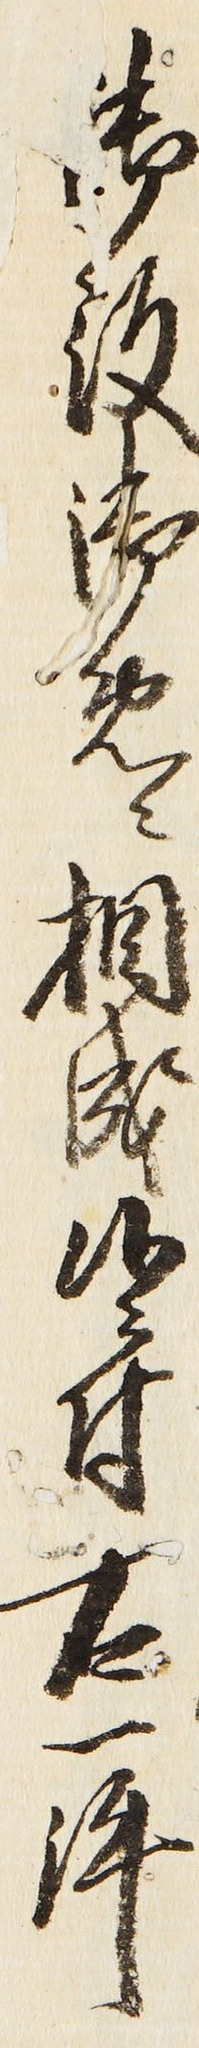御役御免ニ相成候ニ付右一件
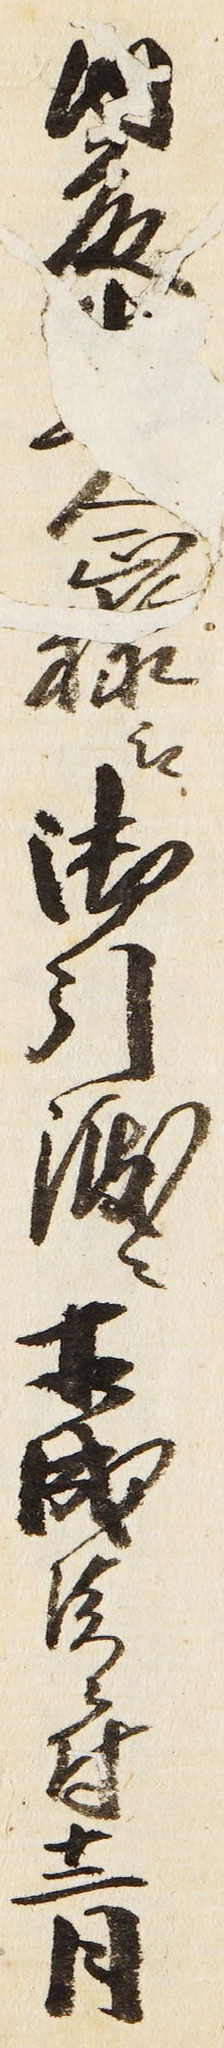内藤隼人正様江御引渡ニ相成候ニ付十二月
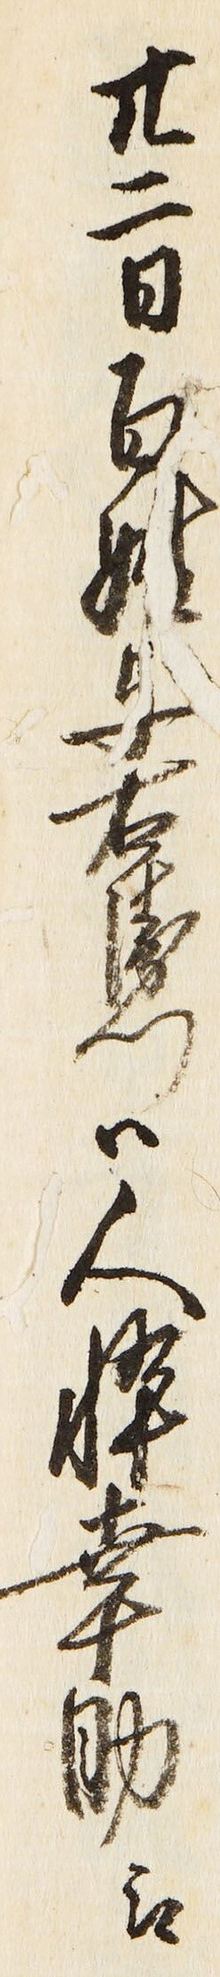廿二日百姓与右衛門同人忰幸助江
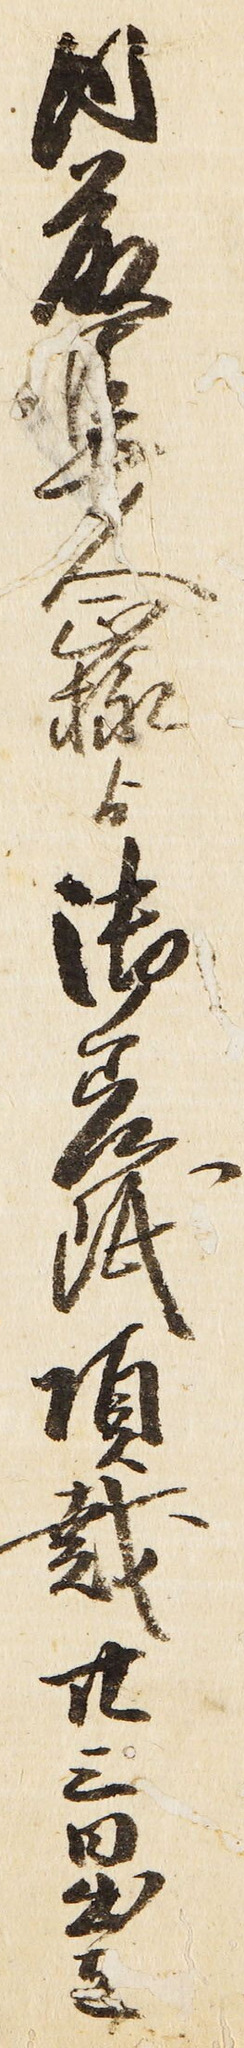内藤隼人正様ゟ御差紙頂戴廿三日出立
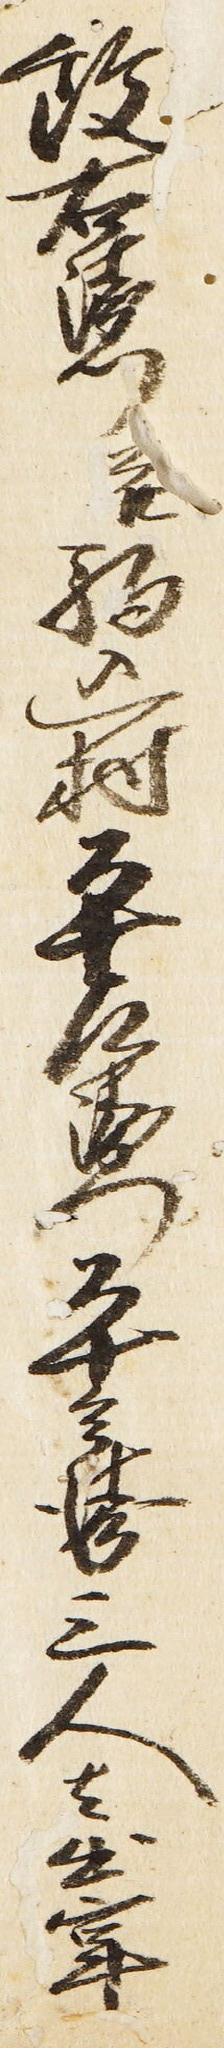政右衛門并駒込村平左衛門平兵衛三人者出牢
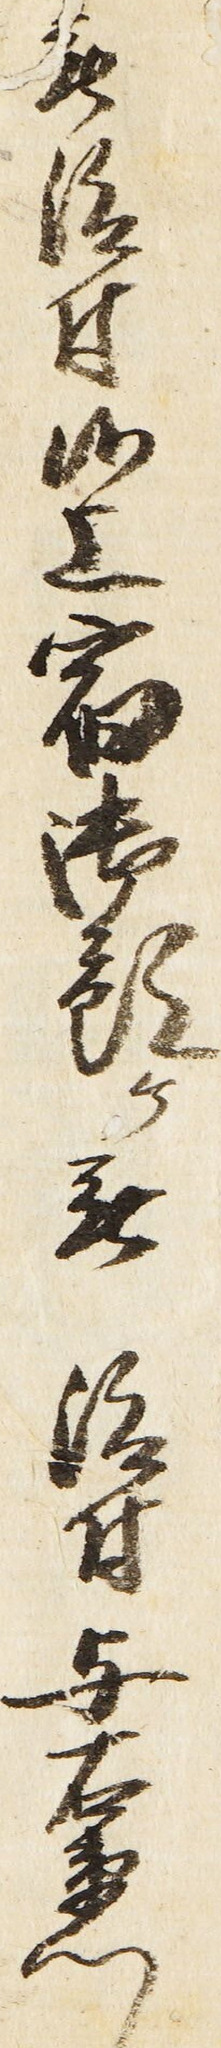被仰付候上宿御預ケ被仰付与右衛門
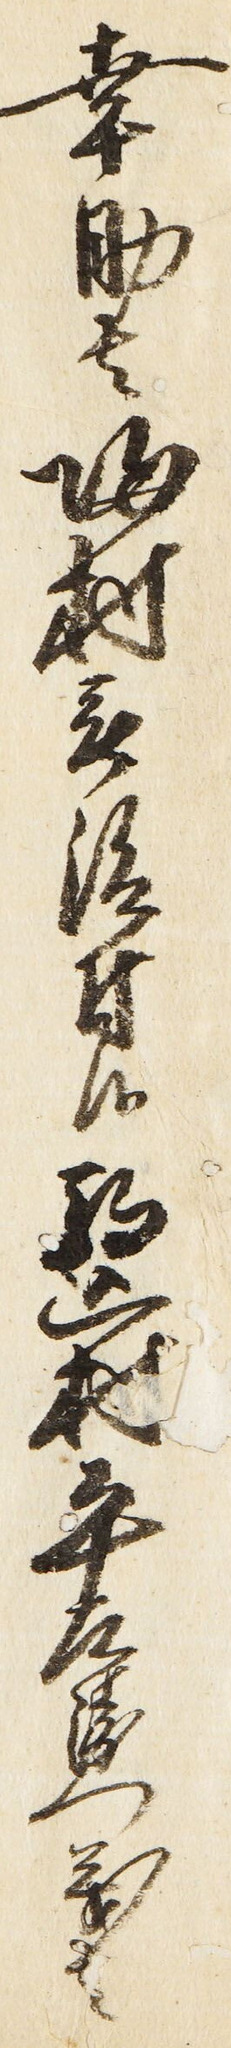幸助者帰村被仰付候駒込村平左衛門義者
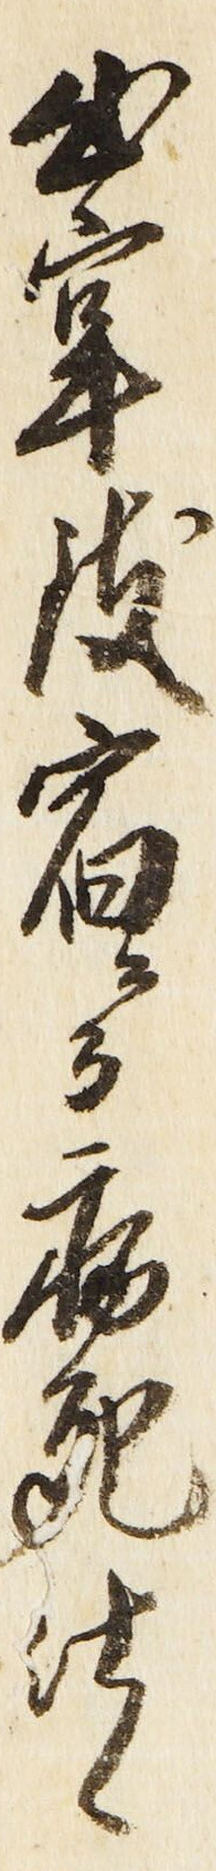出牢致宿ニ而病死仕候
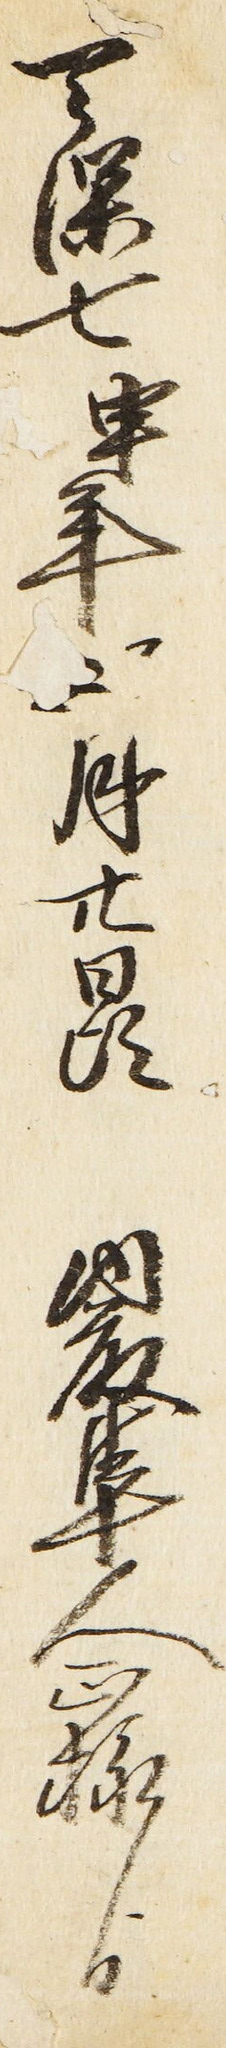天保七申年月廿日頃内藤隼人正様

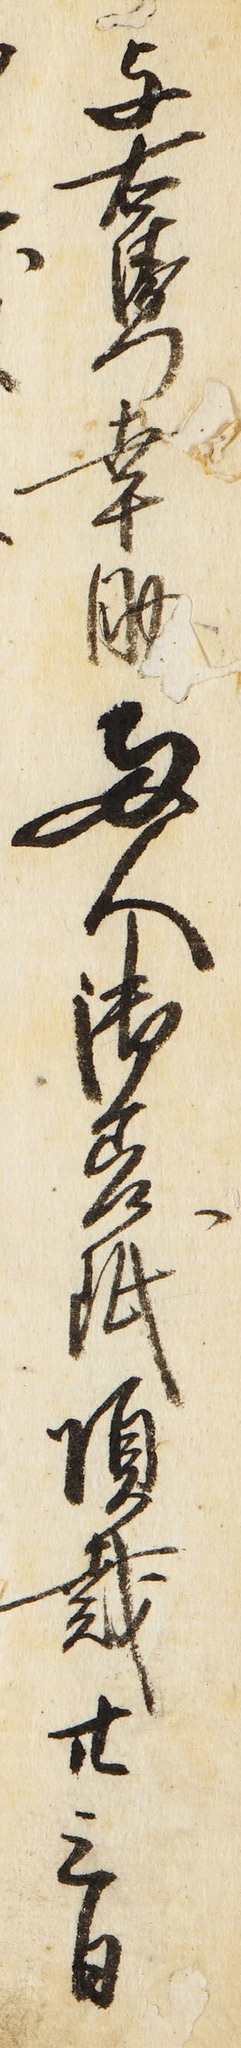与右衛門幸助両人御差紙頂戴廿三日
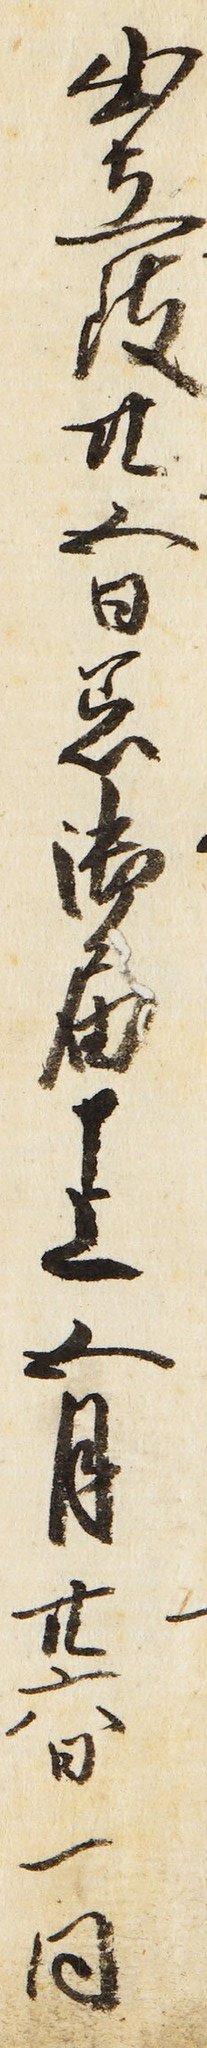出立致廿五日着御届申上五月廿六日一同
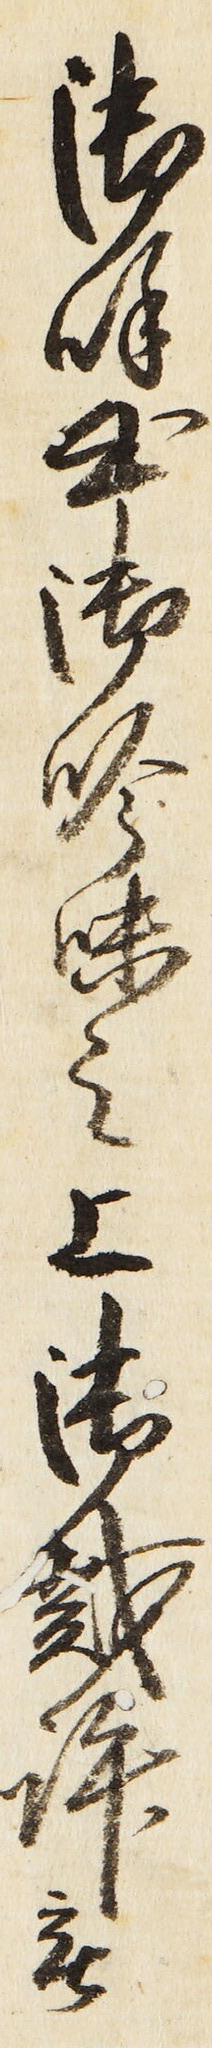御呼出御吟味之上御戴許被
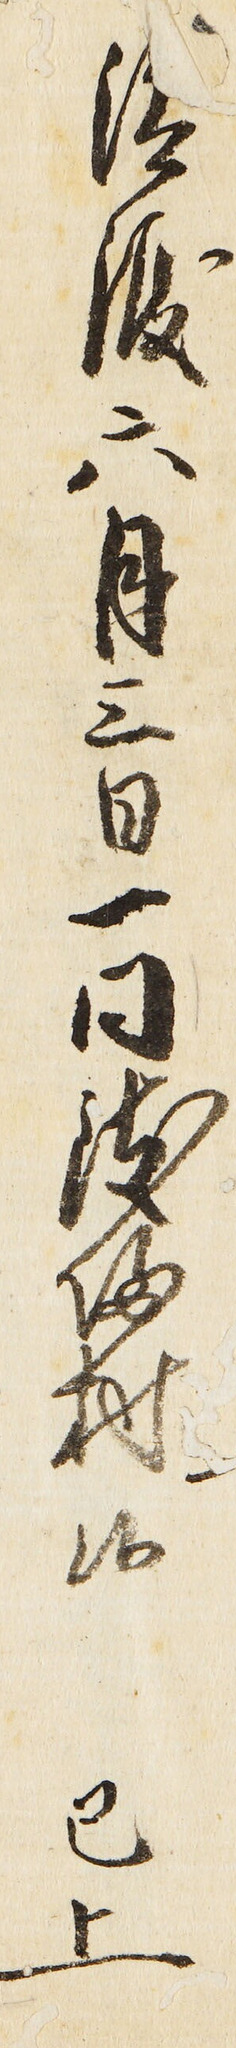仰渡六月三日一同致帰村候已上
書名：難船一件記録
